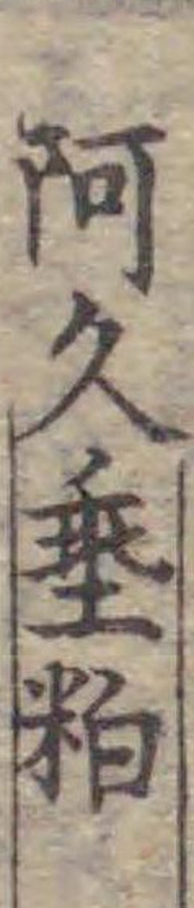阿久垂粕
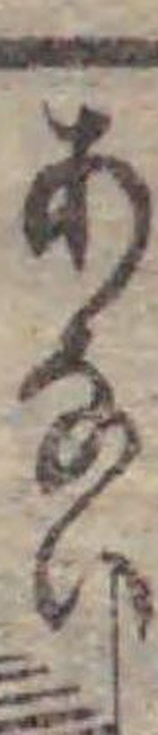あない
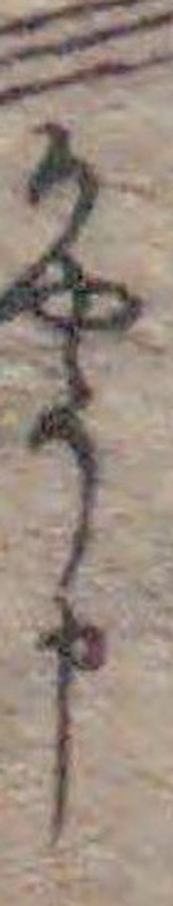かやう申
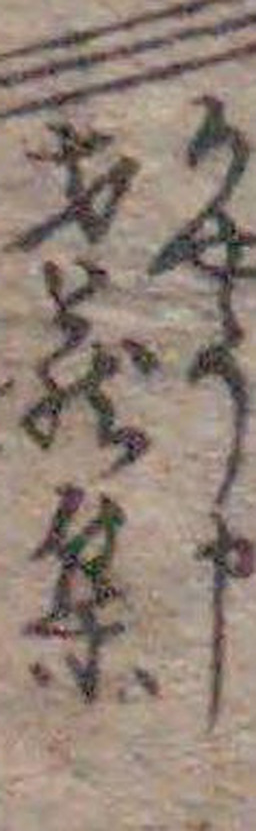才蔵集
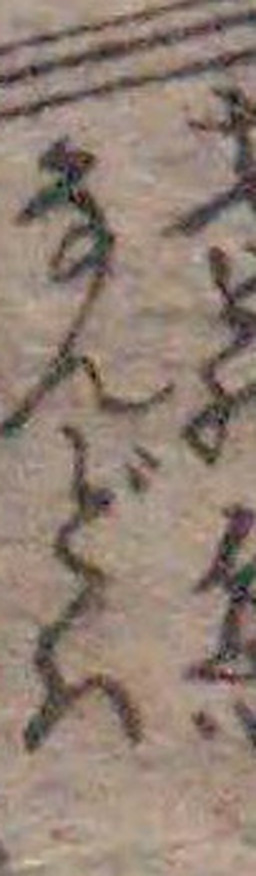なんどは

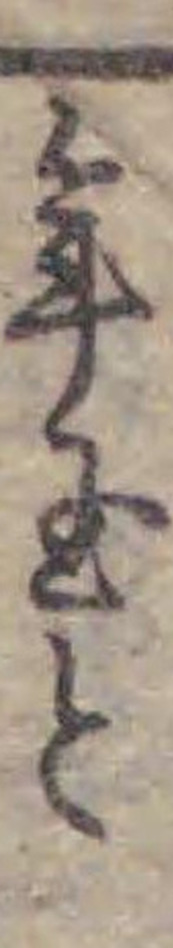年玉と
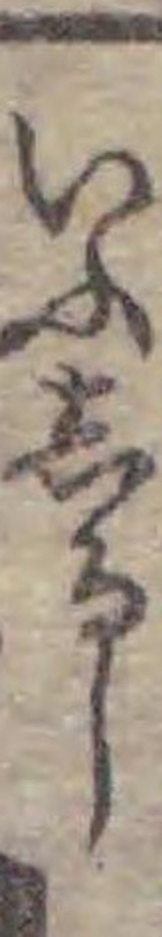いふしるし
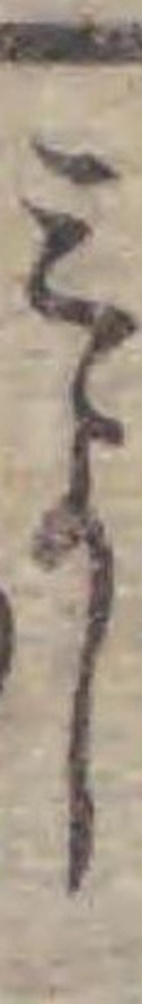みよし
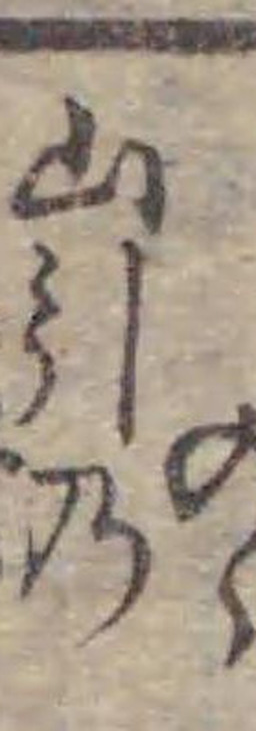山引の
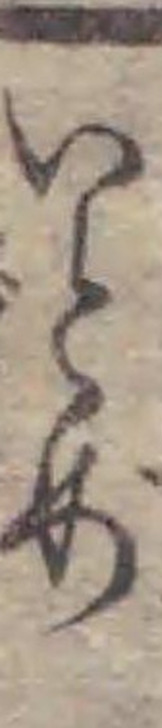つとめ
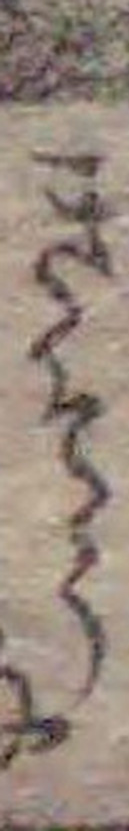きそうな
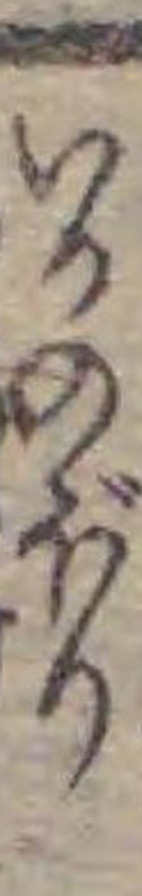いかのぼり
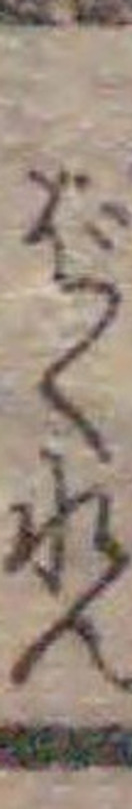ばくれん
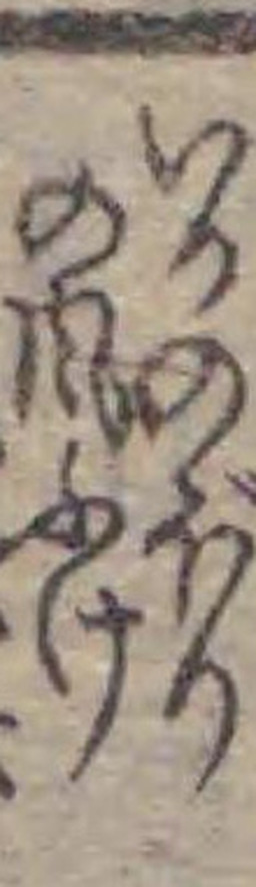の風ふけ
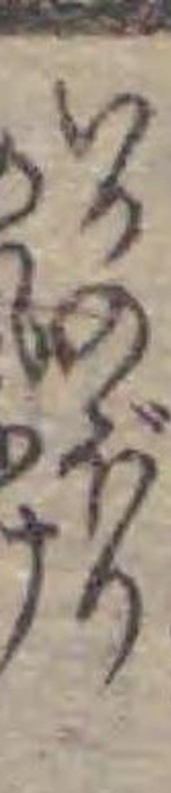いかのぼり
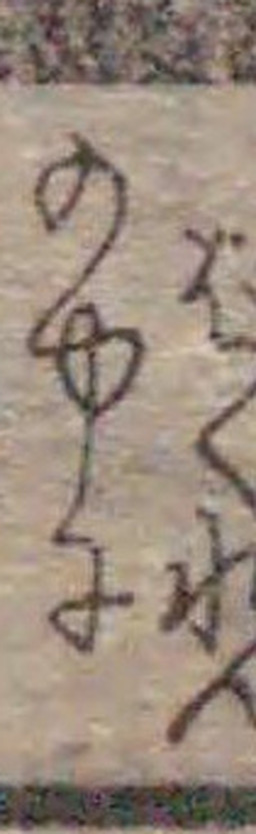の中に
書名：年始御礼帳 : 3巻
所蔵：国立国会図書館 National Diet Library, JAPAN
